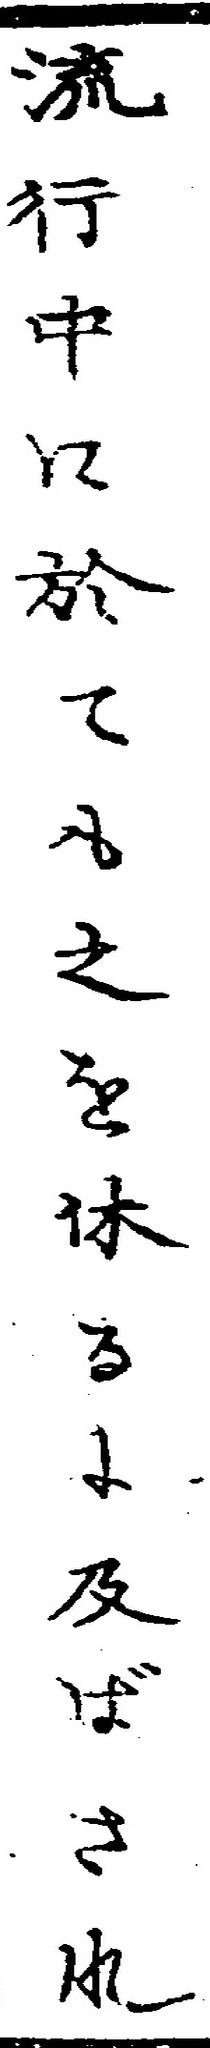流行中に於ても之を休るに及ばされ
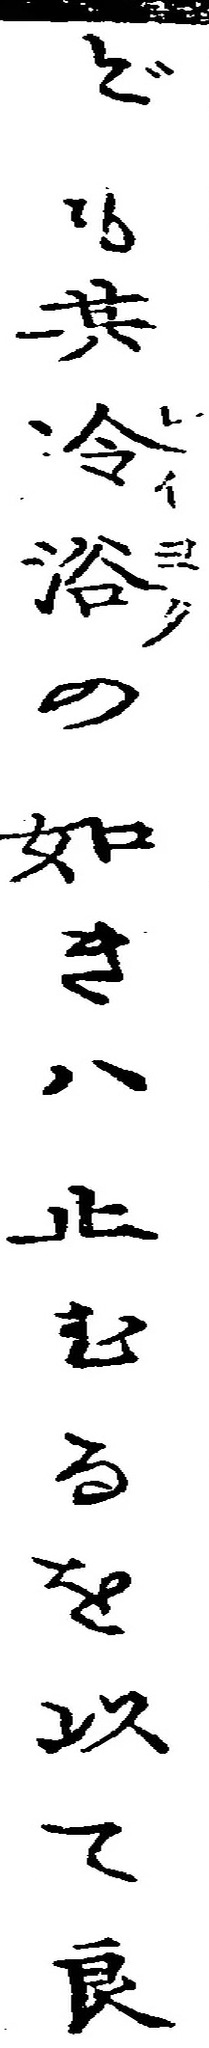ども其冷浴の如きは止むるを以て良
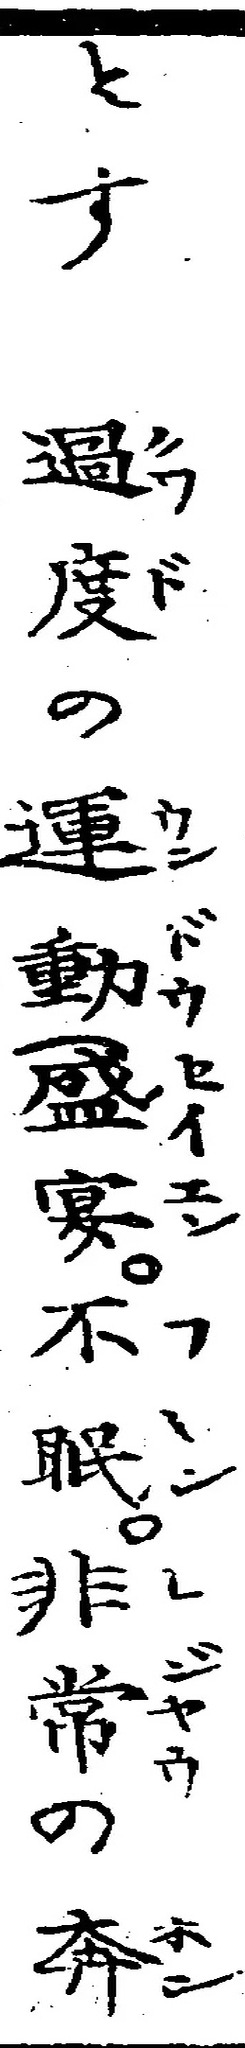とす過度の運動[盛宴。不眠。非常の奔
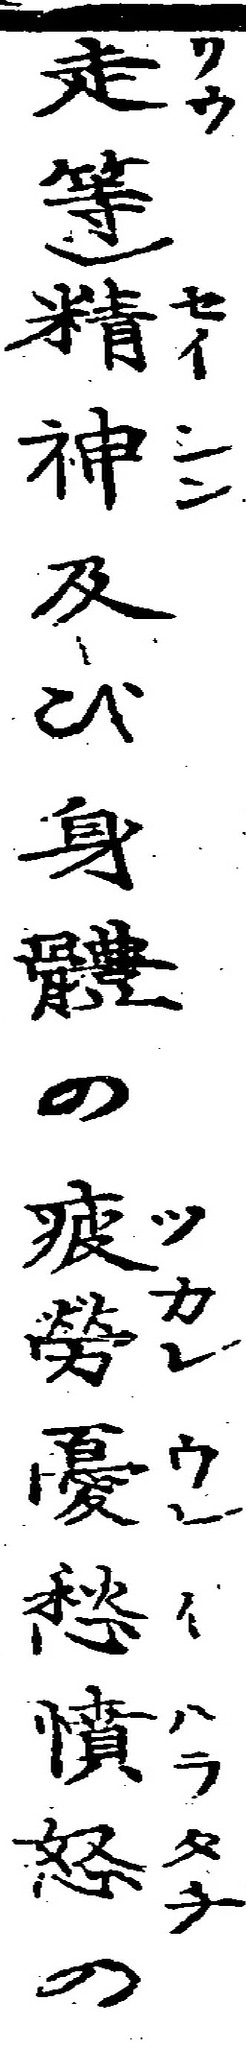走等]精神及び身體の疲労憂愁憤怒の
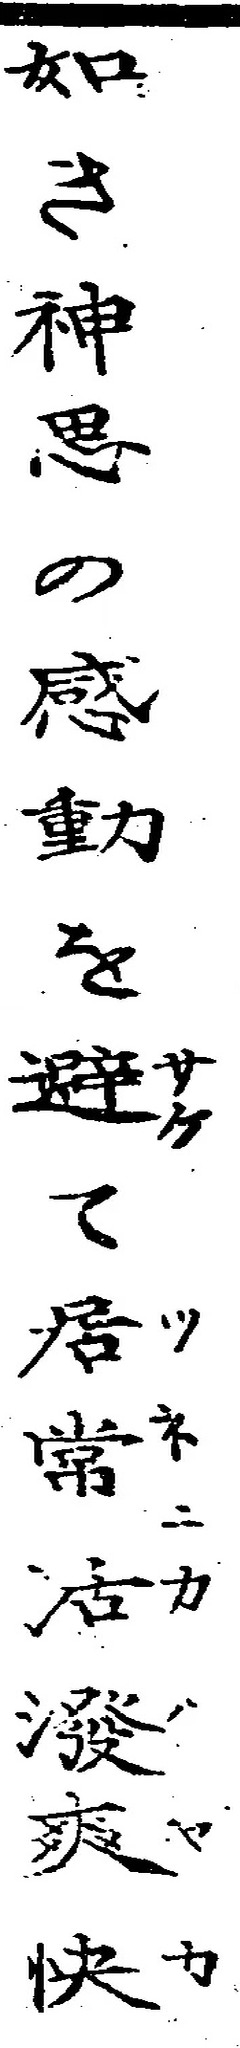如き神思の感動を避て居常活潑爽快
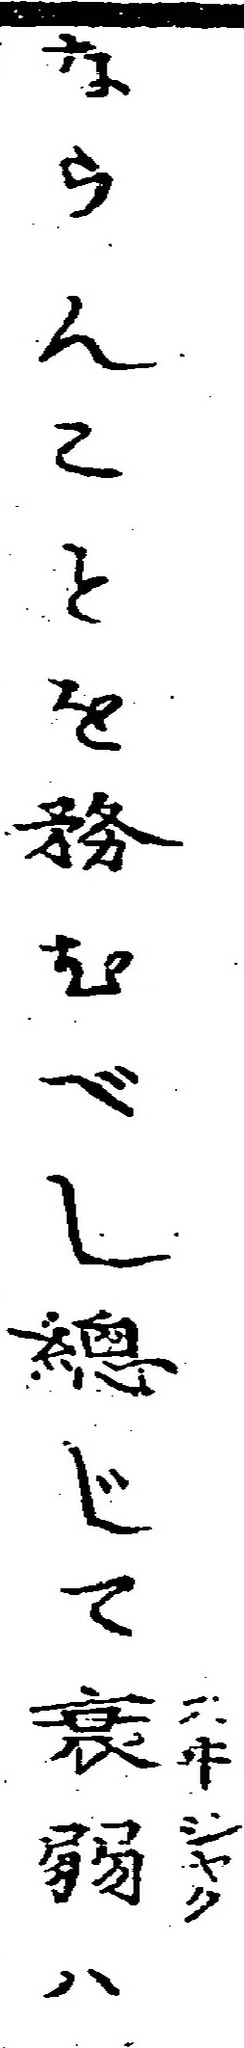ならんことを努むべし總じて衰弱は
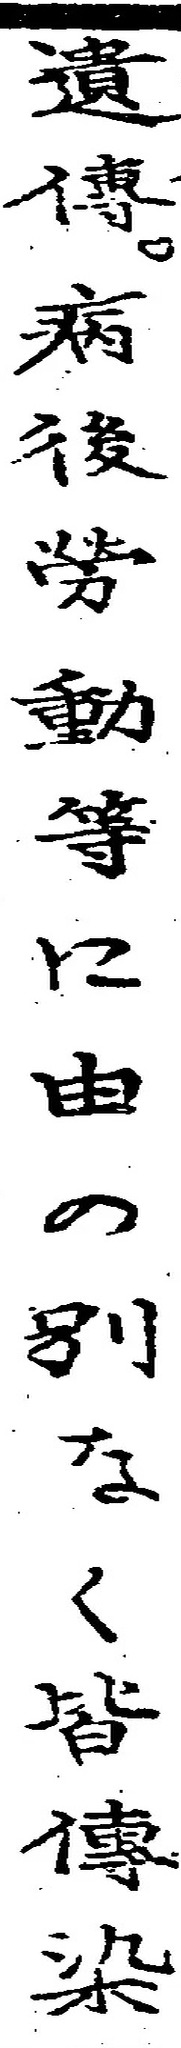遺傳。病後労働等に由の別なく皆傅染
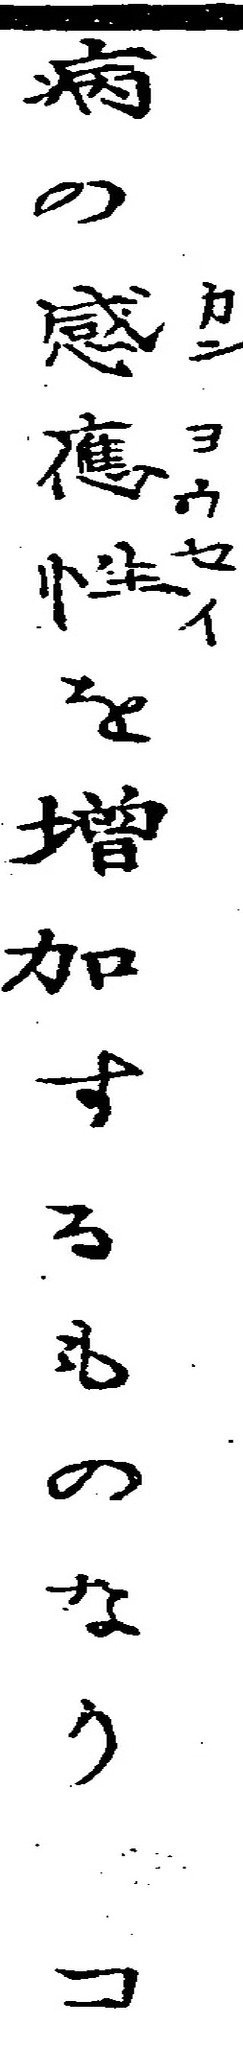病の感應性を増加するものなりコ
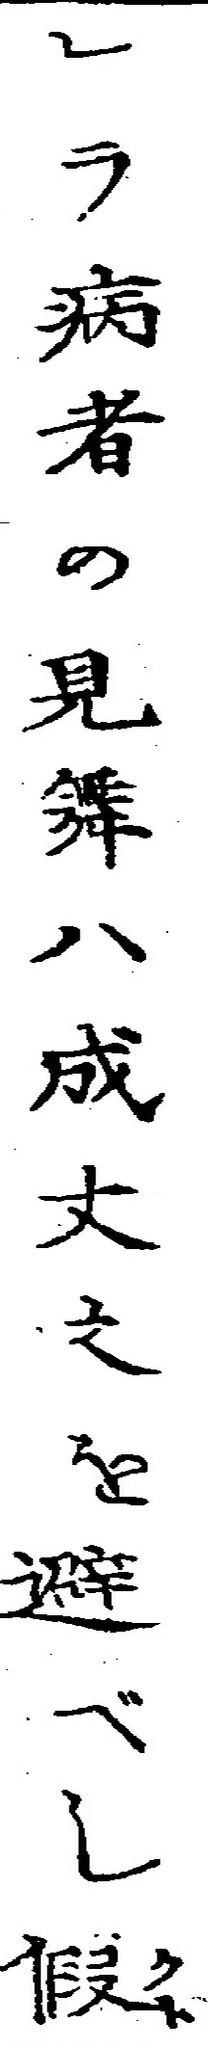レラ病者の見舞いは成丈之を避べし假

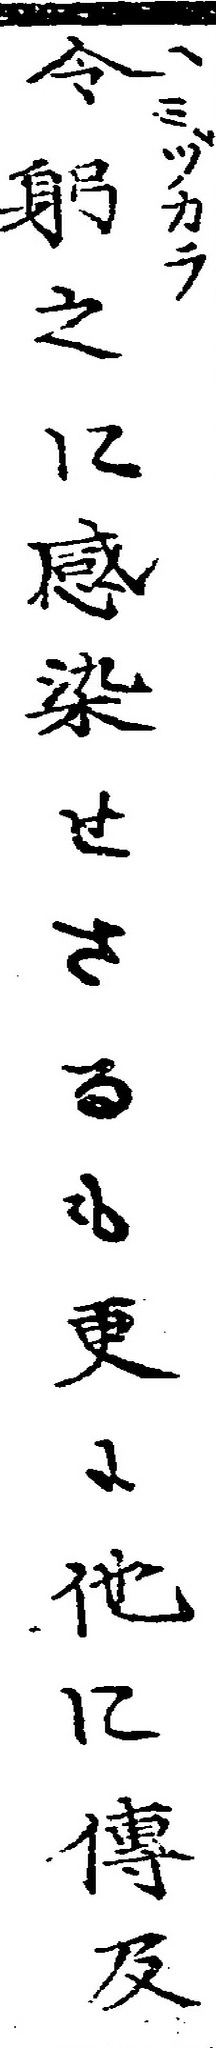令躬之に感染せざるも更に他に傅及
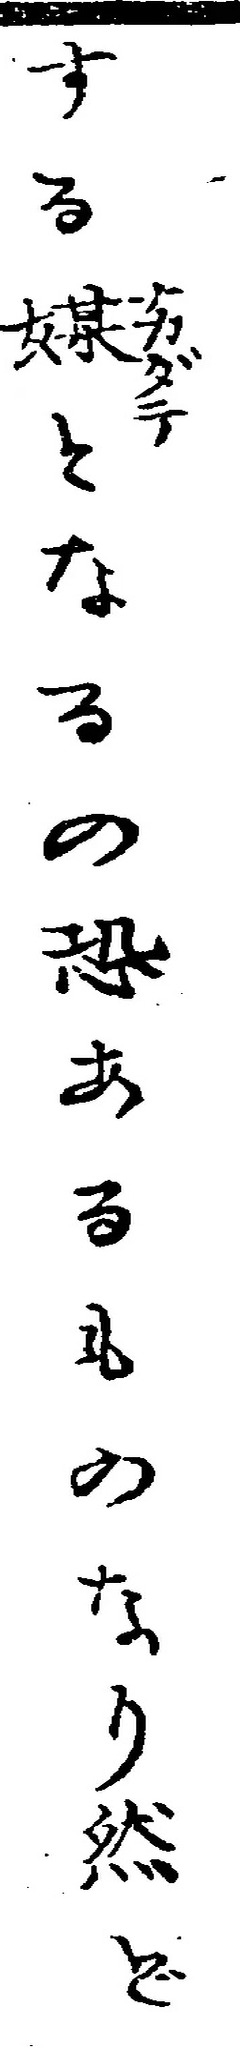する媒となるの恐あるものなり然ど
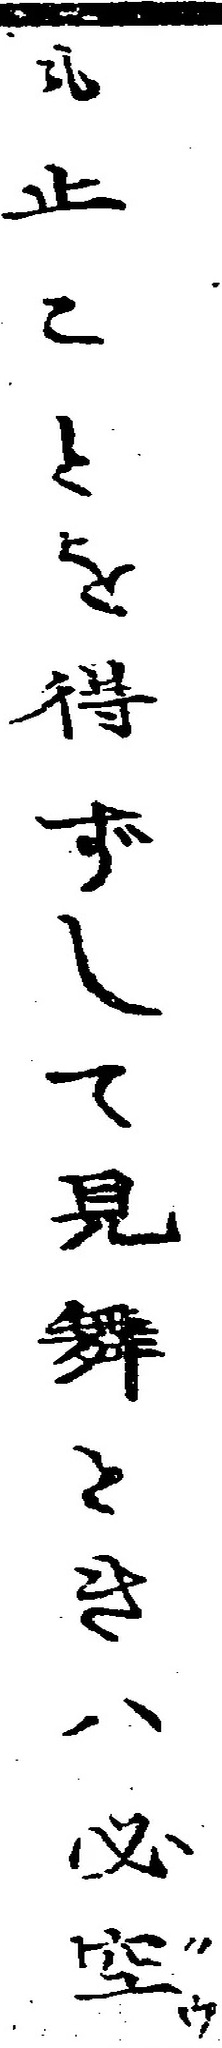も止ことを得ずして見舞ときは必空
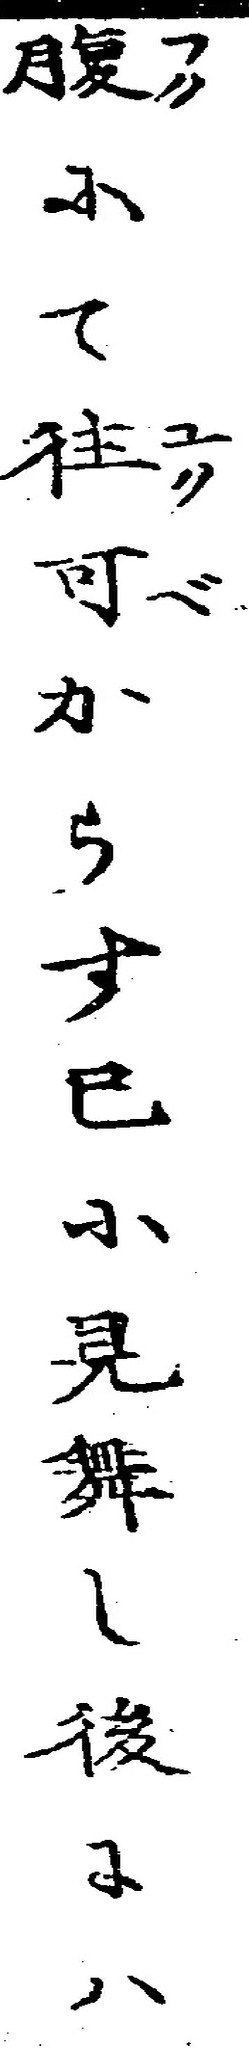腹にて往可からず己に見舞し後には
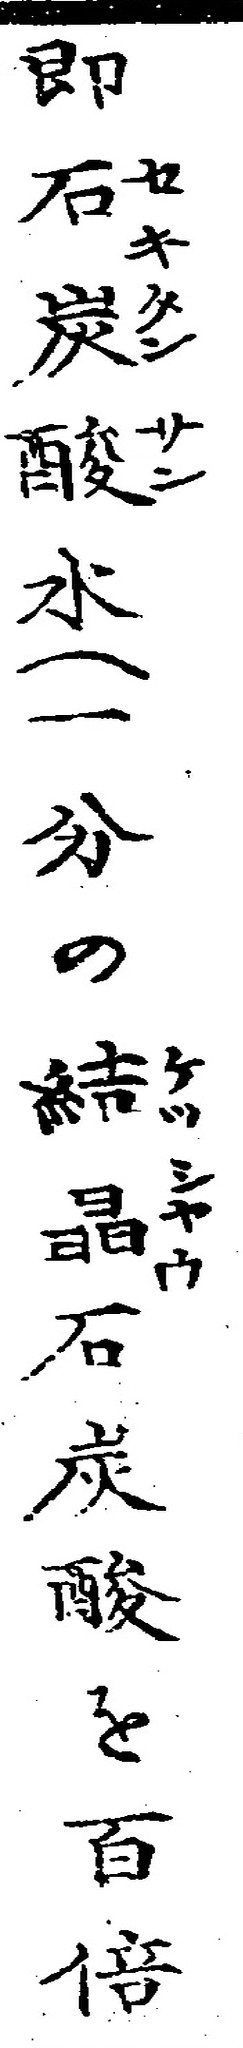即石炭酸水[一分の結晶石炭酸を百倍
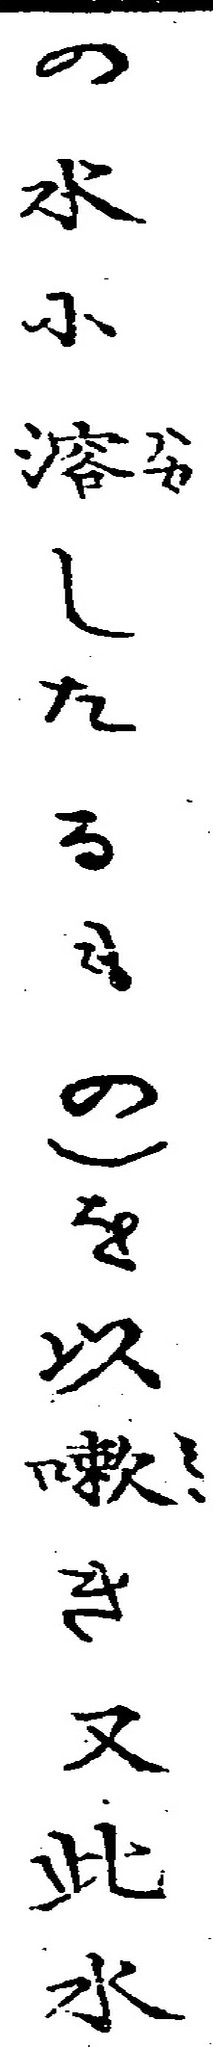の水に溶したるもの]を以嗽き又此水
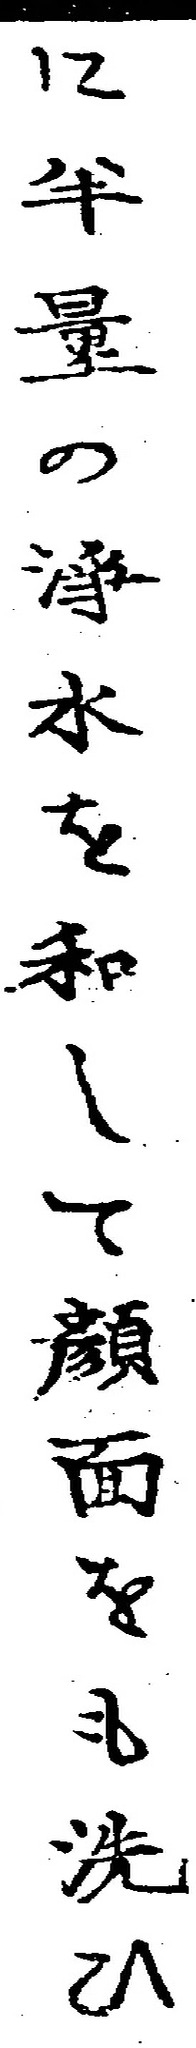に半量の浄水を和して顔面をも洗ひ
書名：虎列剌病予防用法
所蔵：国立国会図書館 National Diet Library, JAPAN
